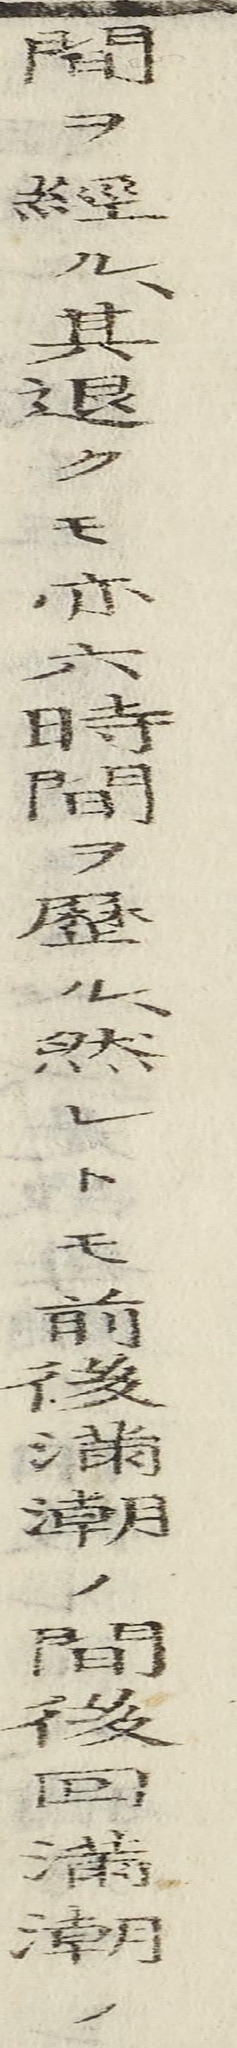間ヲ経ル、其退クモ亦六時間ヲ歴ル、然レトモ前後満潮ノ間後回満潮ノ
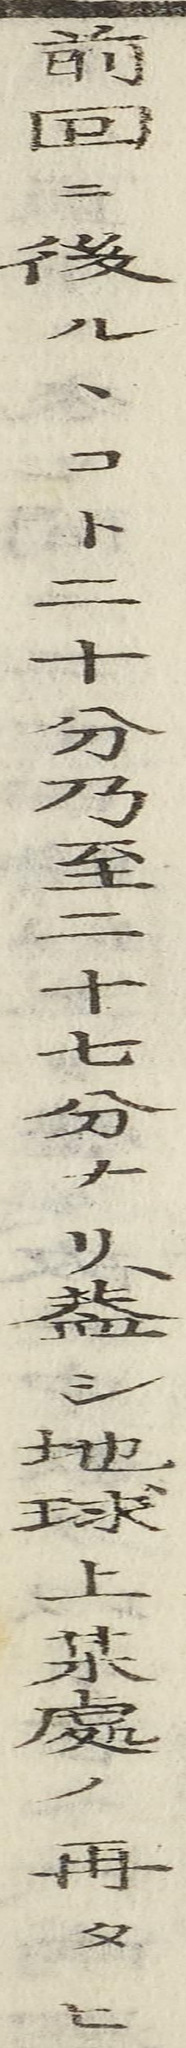前回ニ後ルヽコト二十分乃至二十七分ナリ、蓋シ地球上某処ノ再タヒ

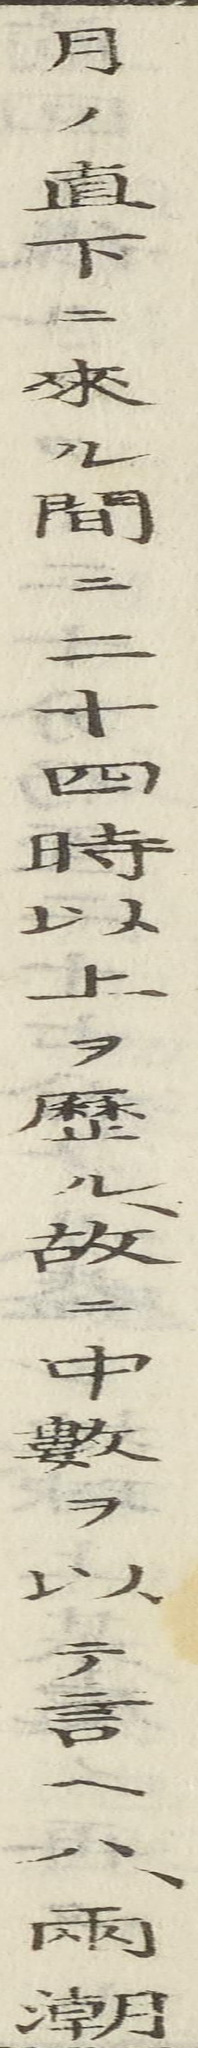月ノ直下ニ来ル間ニ二十四時以上ヲ歴ル、故ニ中数ヲ以テ言ヘハ、雨潮
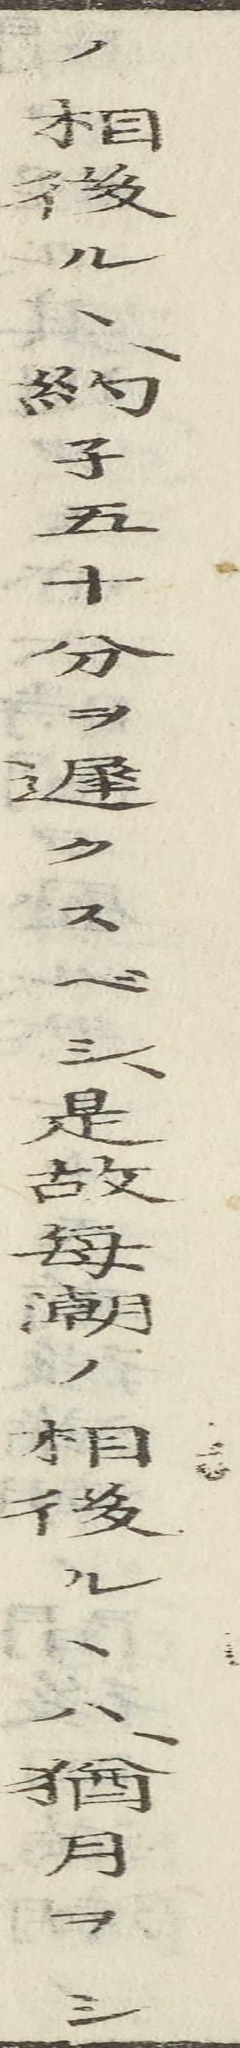ノ相後ルヽ、約子五十分ヲ遅クスベシ、是故毎潮ノ相後ルヽハ、猶月ヲシ
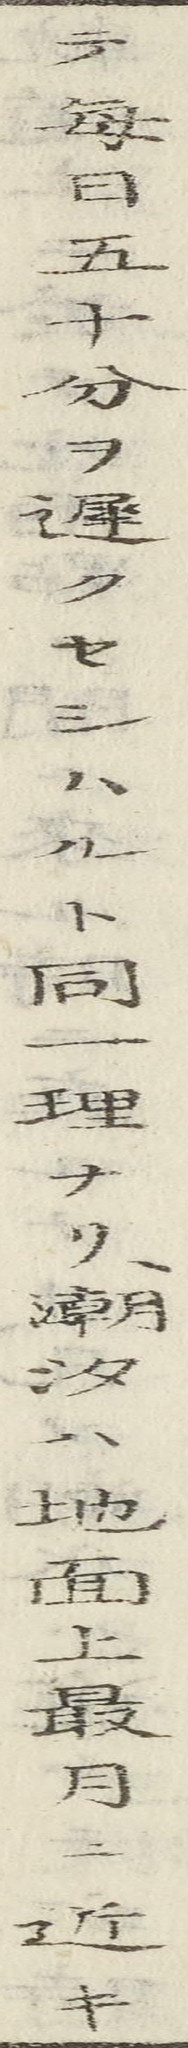テ毎日五十分ヲ遅クセシハルト同一理ナリ、潮汐ハ地面上最月ニ近キ
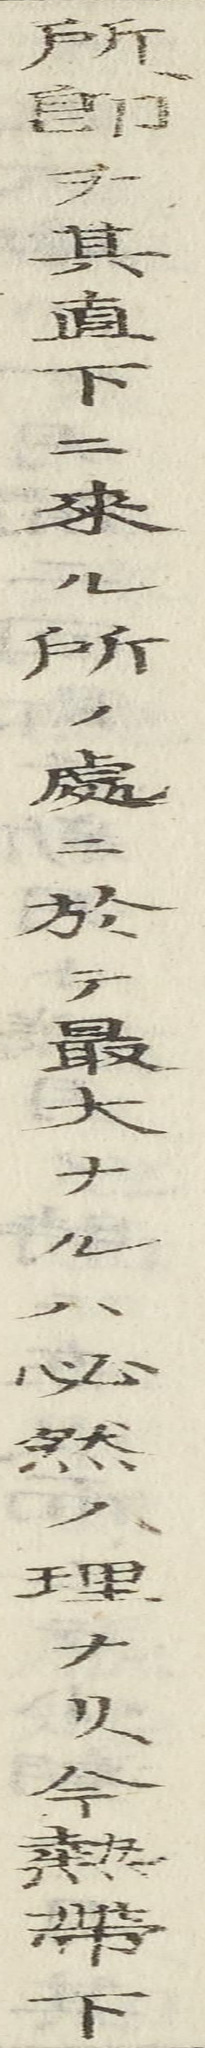所、即チ其直下ニ来ル所ノ処ニ於テ最大ナルハ必然ノ、理ナリ、今熱帯下
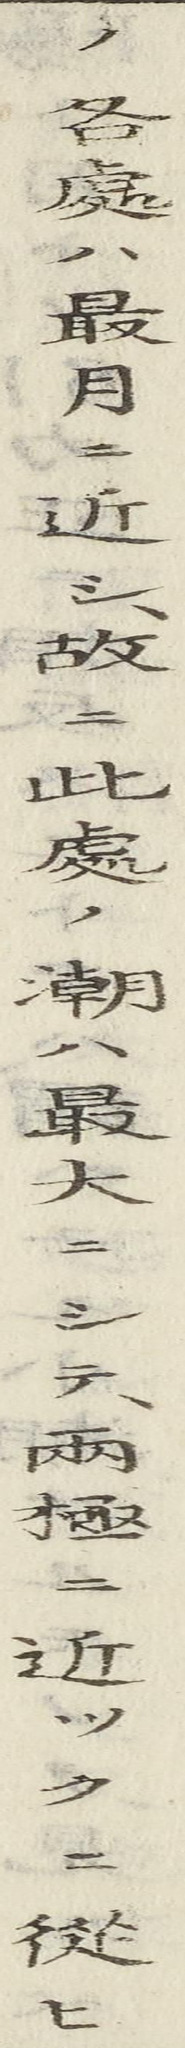ノ各処ハ最月ニ近シ、故ニ此処ノ潮ハ最大ニシテ、両極ニ近ツクニ従ヒ
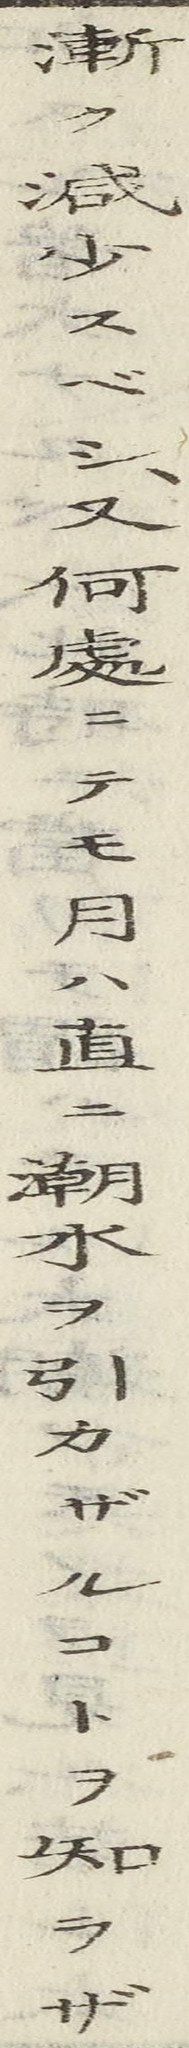漸ク減少スベシ、又何処ニテモ月ハ直ニ潮水ヲ引カザルコトヲ知ラザ
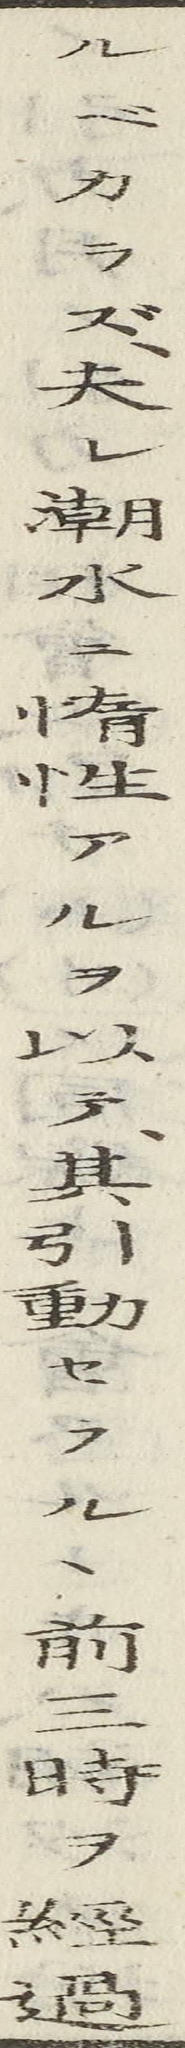ルベカラズ、夫レ潮水ニ惰性アルヲ以テ、其引動セラルヽ前三時ヲ経過
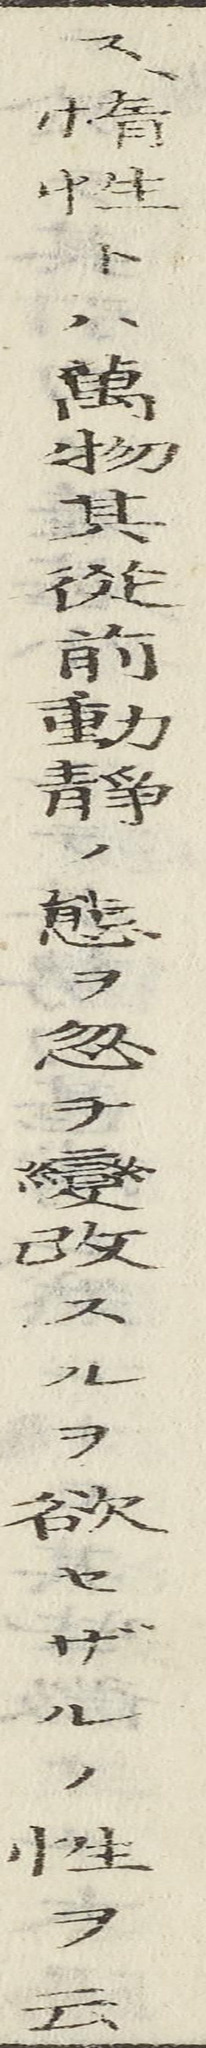ス、惰性トハ万物其従前動静ノ態ヲ忽チ変改スルヲ欲セザルノ性ヲ云
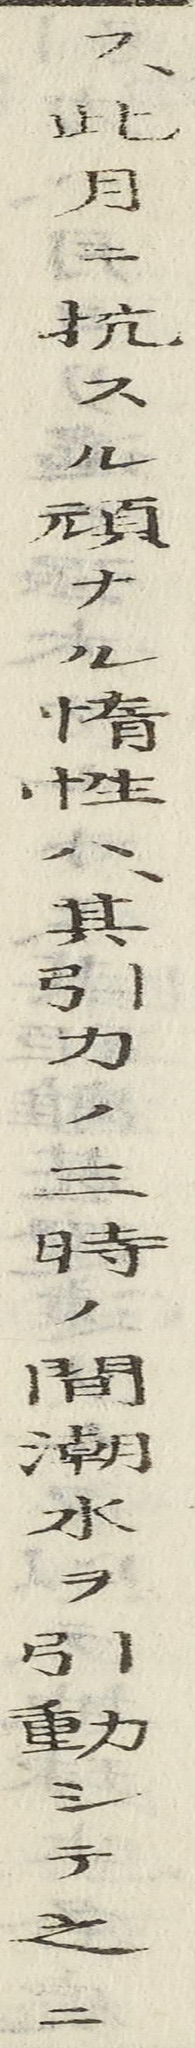フ、此月ニ抗スル頑ナル惰性ハ、其引力ノ三時ノ間潮水ヲ引動シテ之ニ
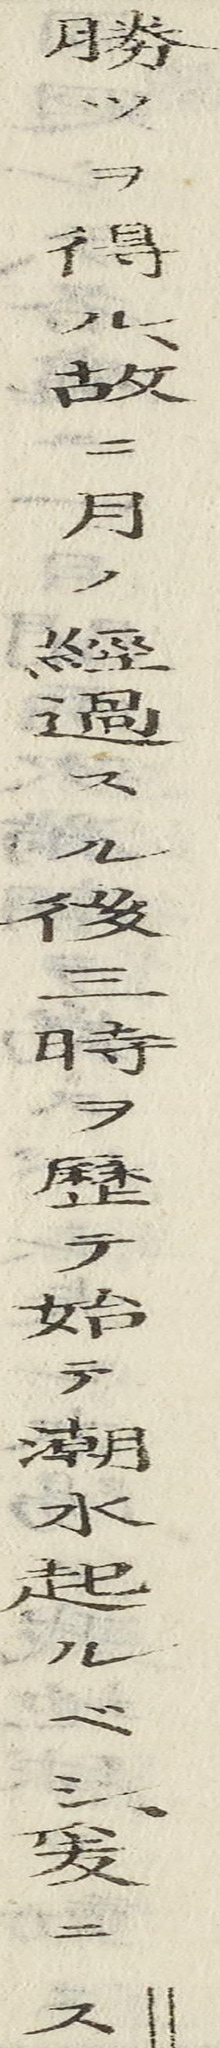勝ツヲ得ル、故ニ月ノ経過スル後三時ヲ歴テ始テ潮水起ルベシ、爰ニス
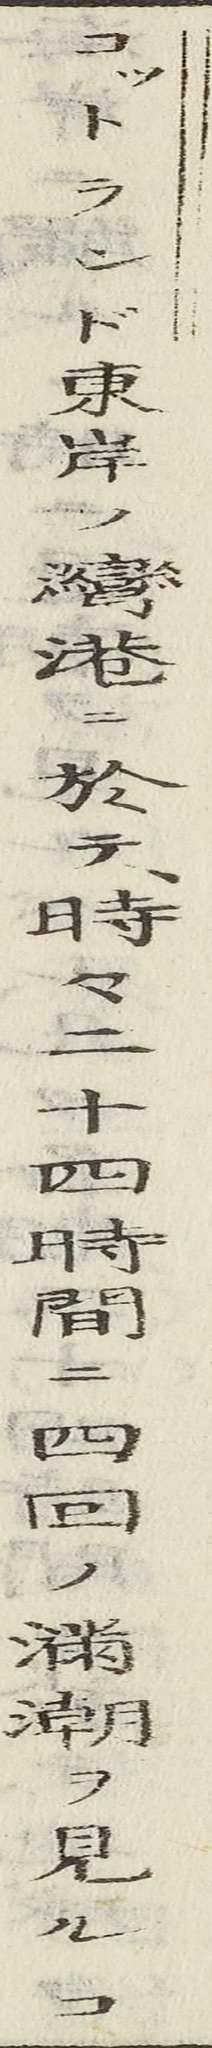コットランド東岸ノ湾港ニ於テ、時々二十四時間ニ四回ノ満潮ヲ見ルコ
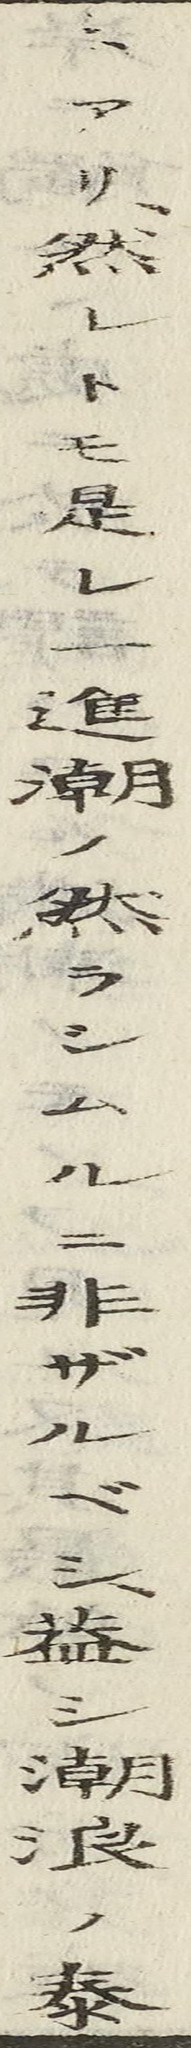トアリ、然レトモ是レ一進潮ノ然ラシムルニ非ザルベシ、蓋シ潮浪ノ泰
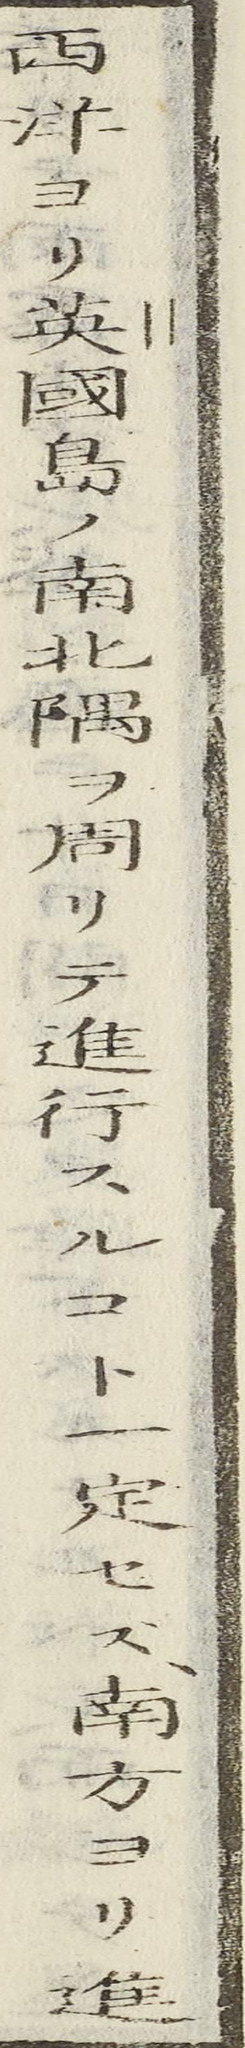西洋ヨリ英国島ノ南北隅ヲ周リテ進行スルコト一定セズ、南方ヨリ進
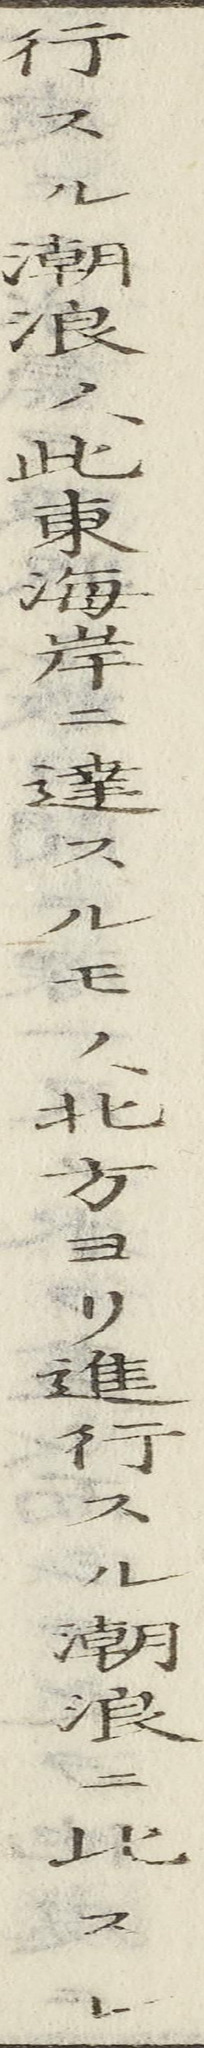行スル潮浪ノ、此東海岸ニ達スルモノ、北方ヨリ進行スル潮浪ニ比スレ
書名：百科全書　地文學　全
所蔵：東京大学地震研究所図書室 Earthquake Research Institute Library, The University of Tokyo, JAPAN
